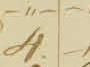4.
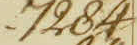7284
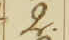2.
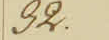32.
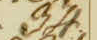34.
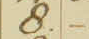8.
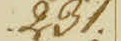231.
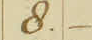8.
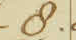8.
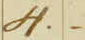4.
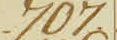707.
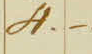4.
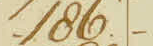186.
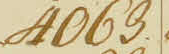4063.
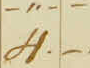4.
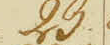23.
